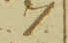7.
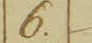6.
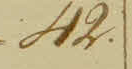42.
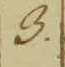3.
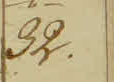32.
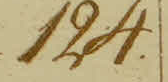124.
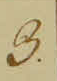3.
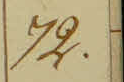72.
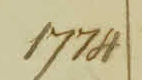1774
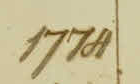1774
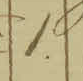1.
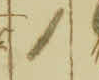1
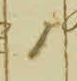1
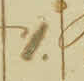1.
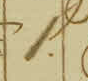1.
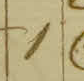1
